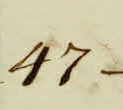47
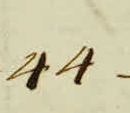44
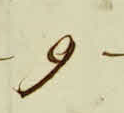9
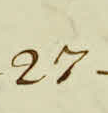27
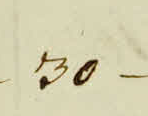30
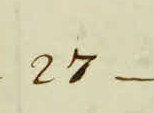27
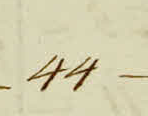44
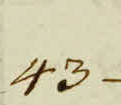43
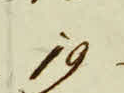19
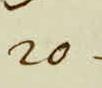20
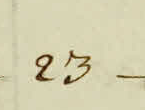23
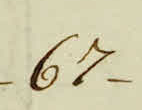67
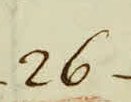26
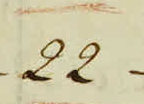22
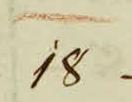18
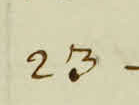23
